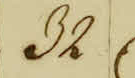32
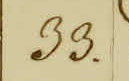33.
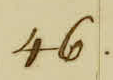46
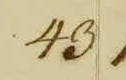43
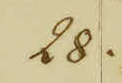28
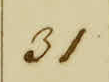31
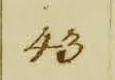43
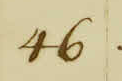46
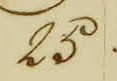25
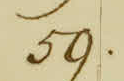59
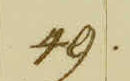49
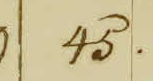45
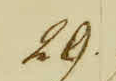29
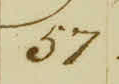57
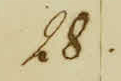28
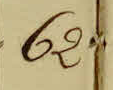62
